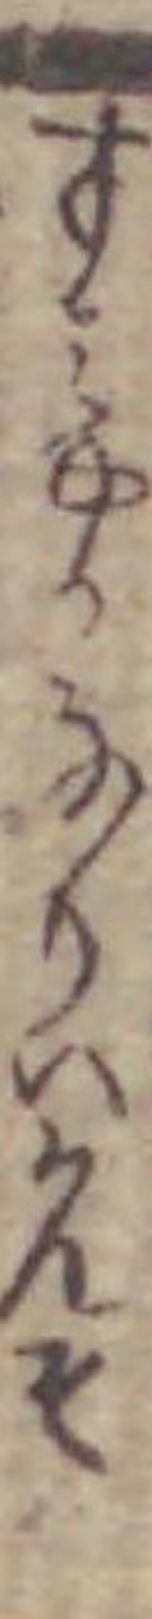すみやかなりいかんそ
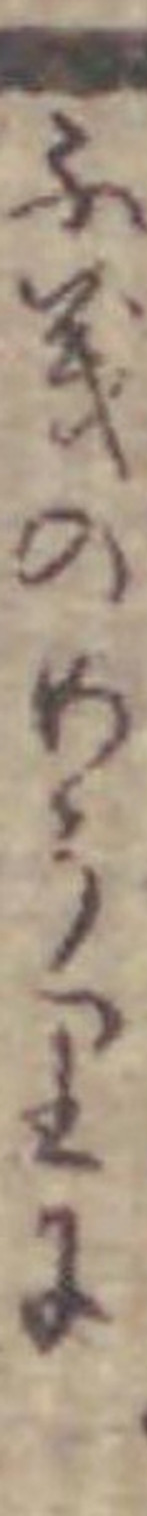不義のめうりに
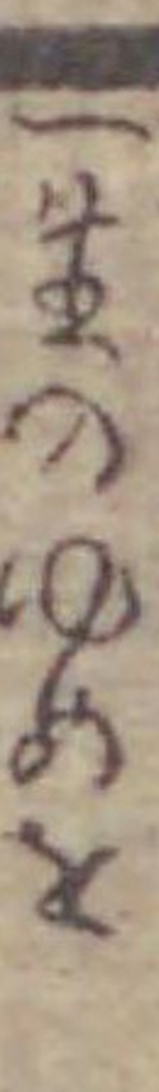一生のゆめを
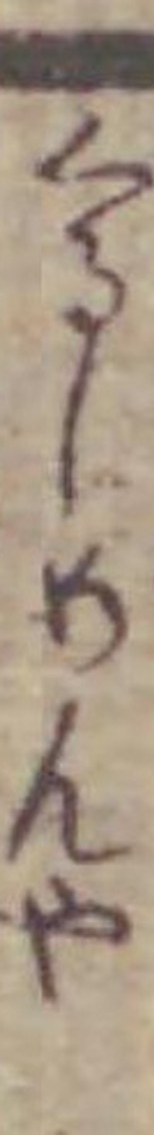くるしめんや
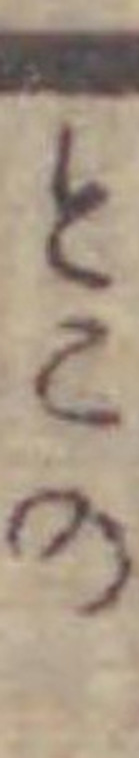とこの
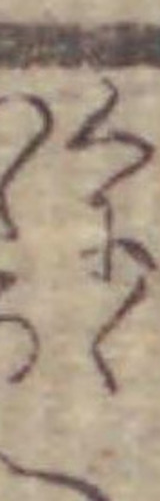くにゝ

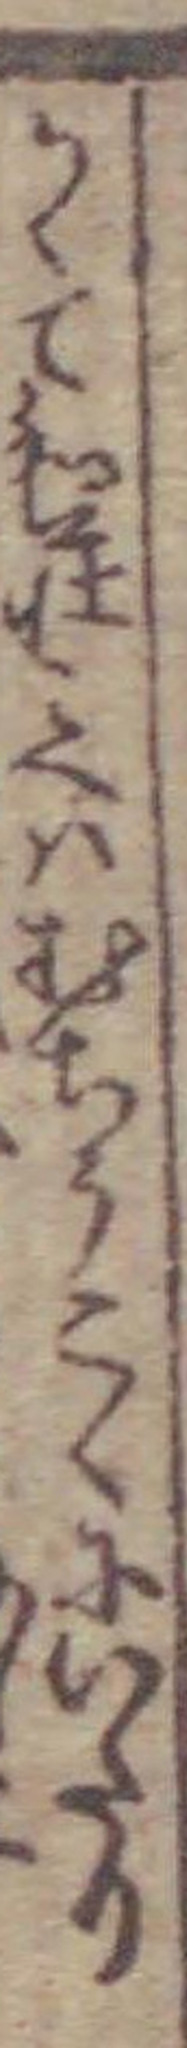かくて和荘兵へはむちうこくにいたり
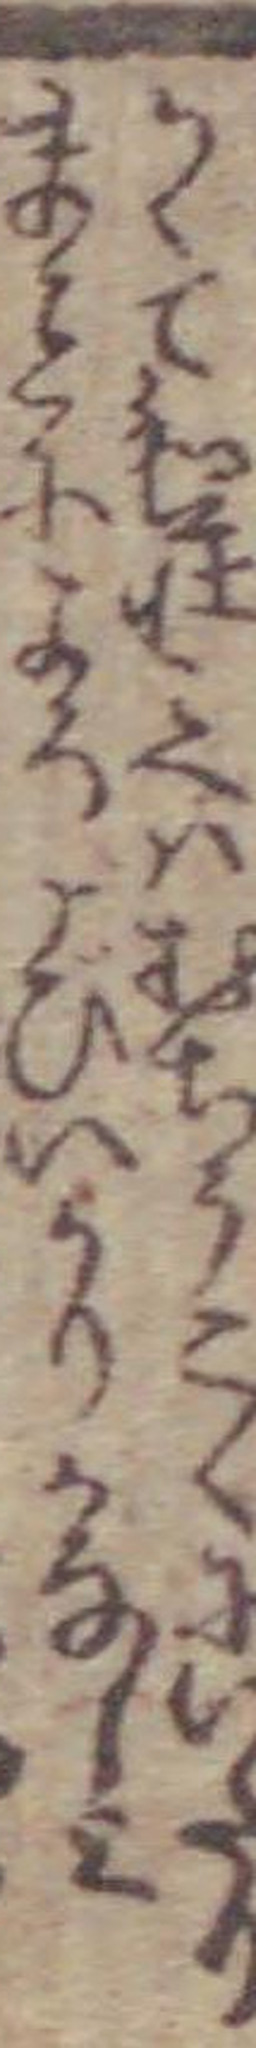まことによろこびいかりかなしみ
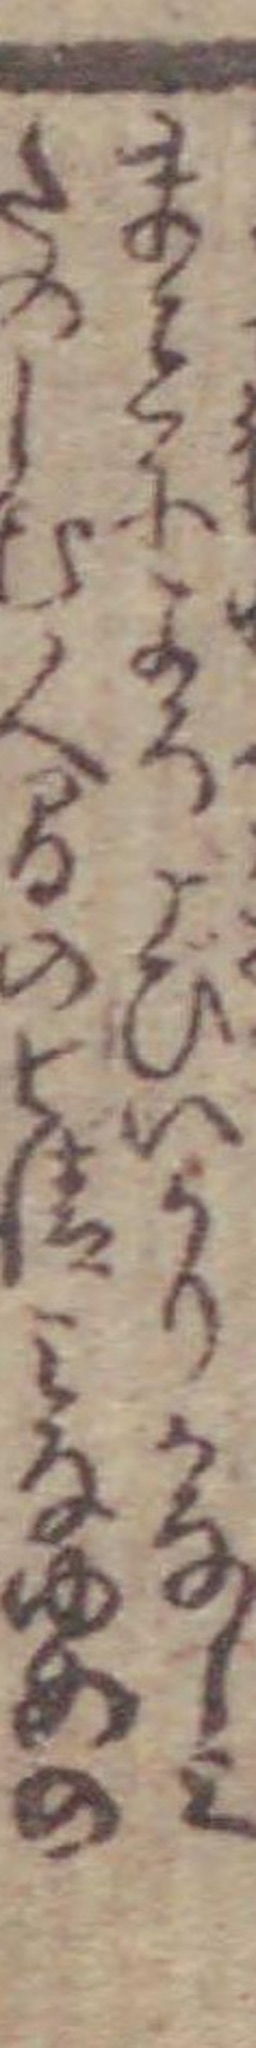たのしむ人間の七情みなゆめの
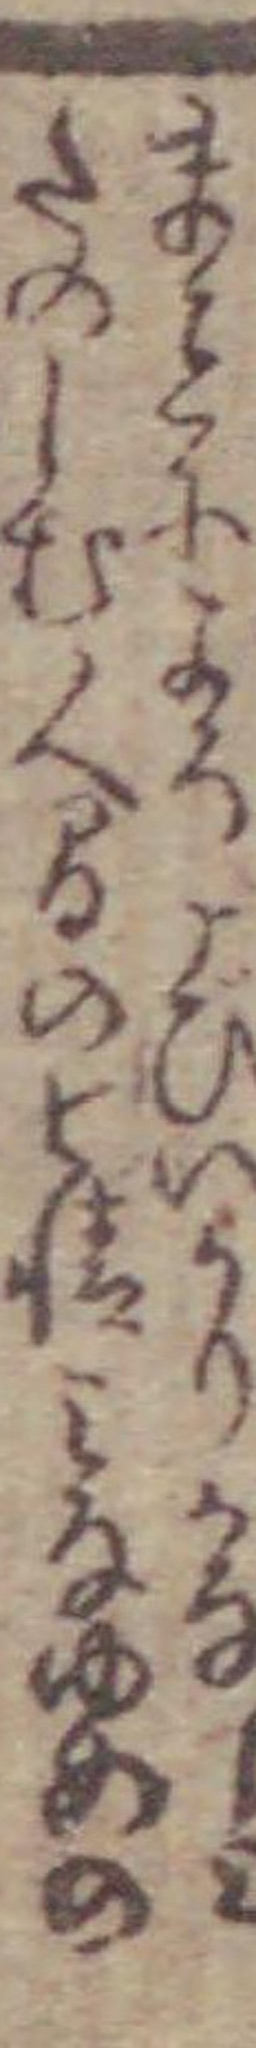たのしむ人間の七情みなゆめの
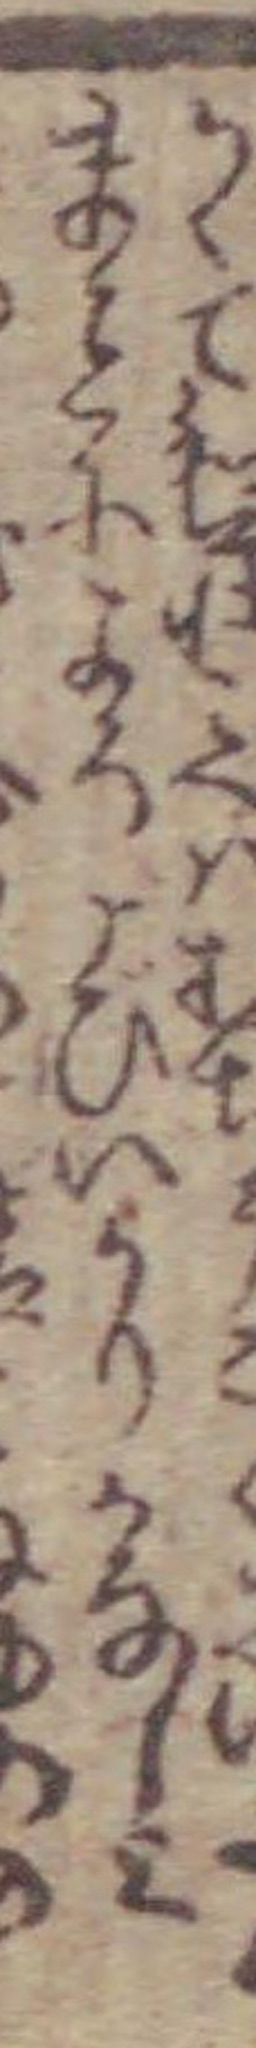まことによろこびいかりかなしみ
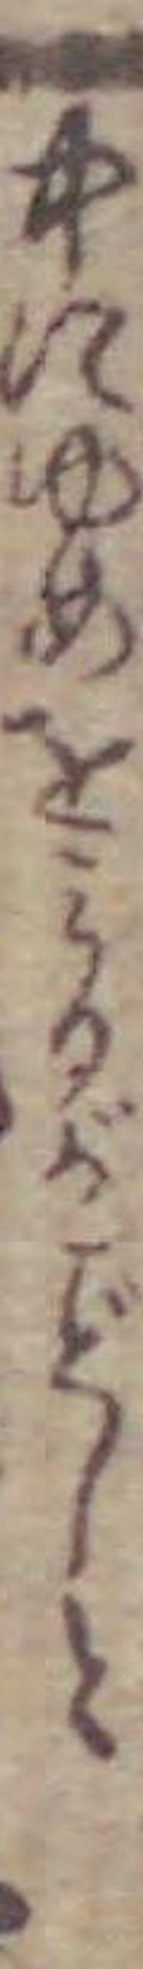中にゆめをみるがごとしと
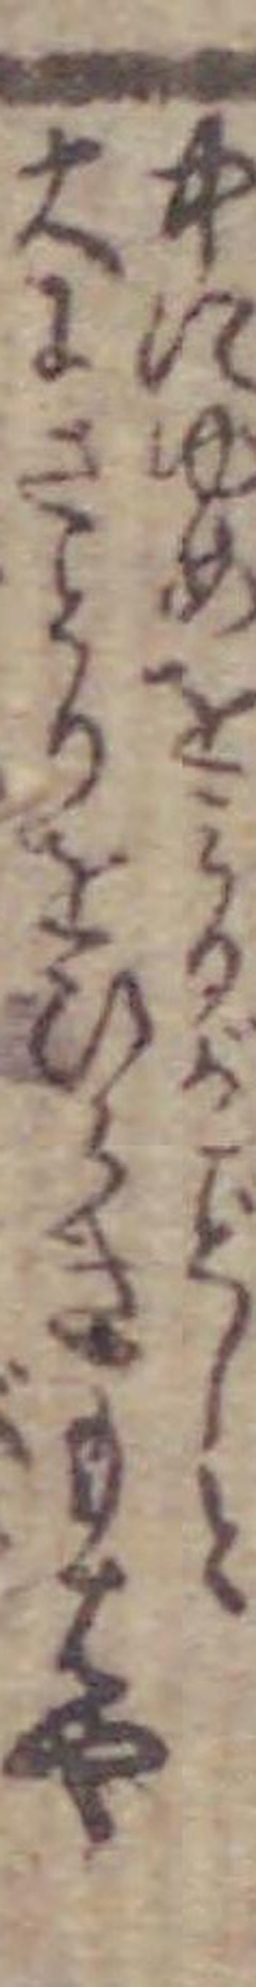大にさとりをひらきもはや
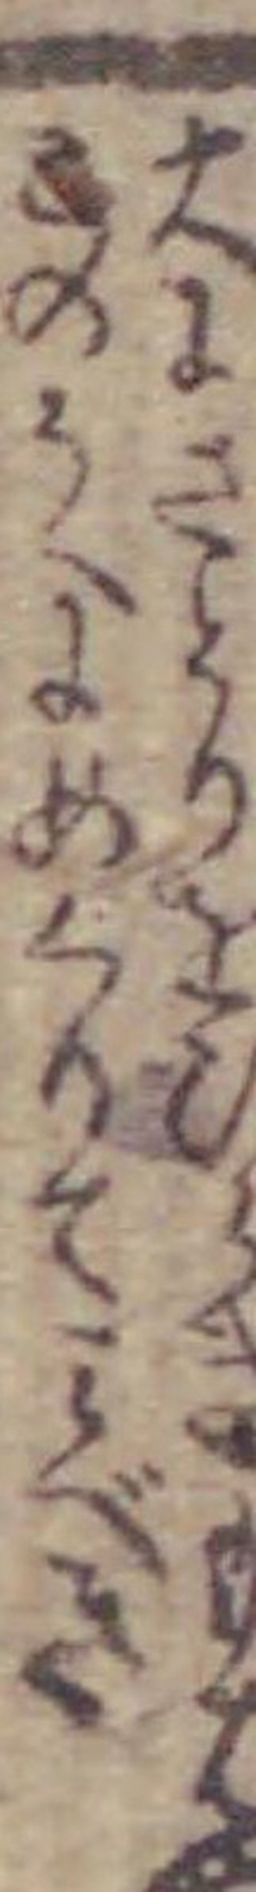このうへにめくりてみべき
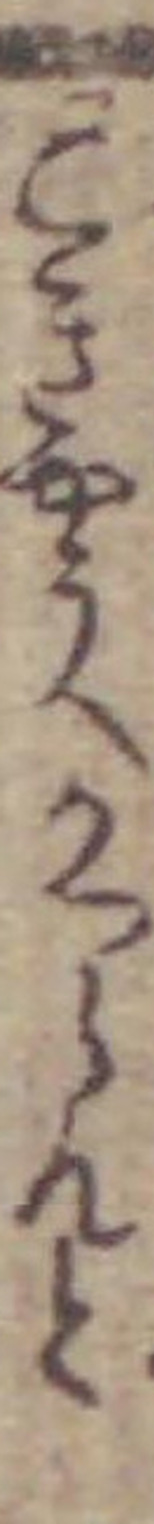こきやうへかへらんと
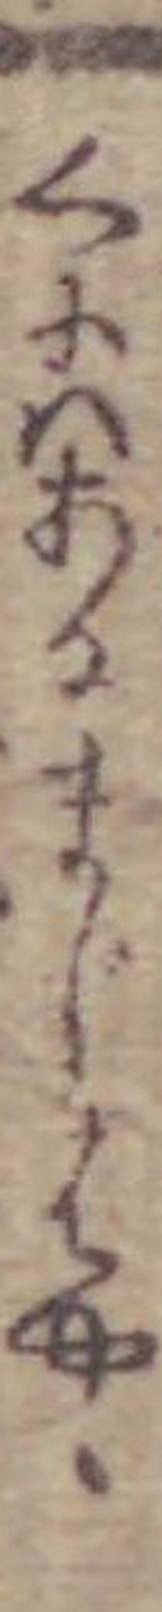くにはあるまじはやく
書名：和荘兵衛後日話 : 3巻
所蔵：国立国会図書館 National Diet Library, JAPAN
